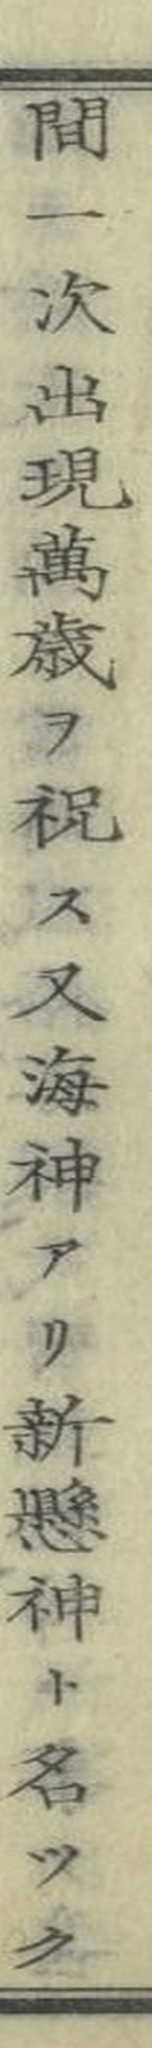間一次出現萬歳ヲ祝ス又海神アリ新懸神ト名ツク
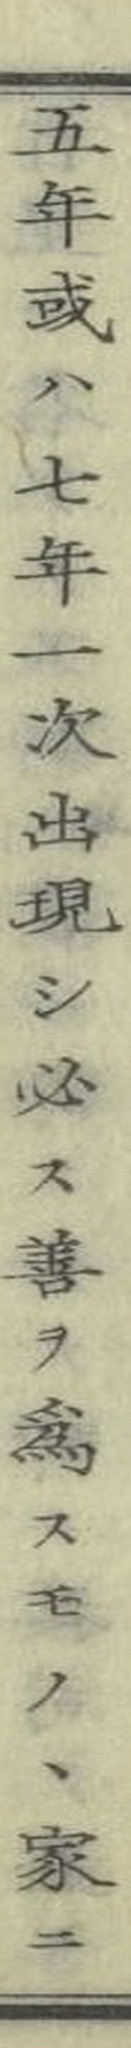五年或ハ七年一次出現シ必ス善ヲ爲スモノヽ家ニ
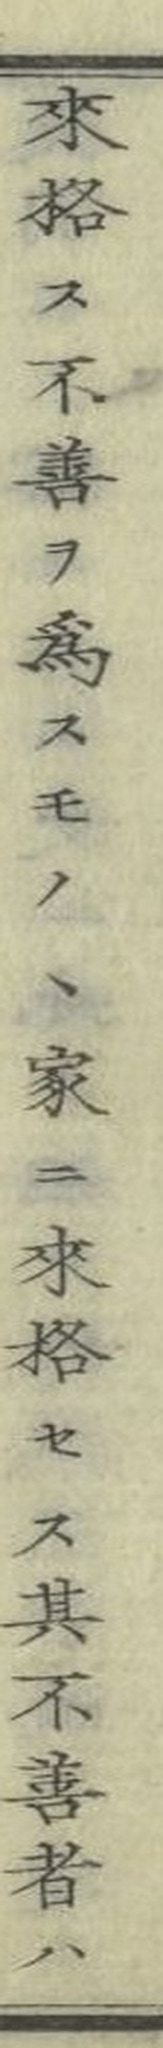來格ス不善ヲ爲スモノヽ家ニ來格セス其不善者ハ
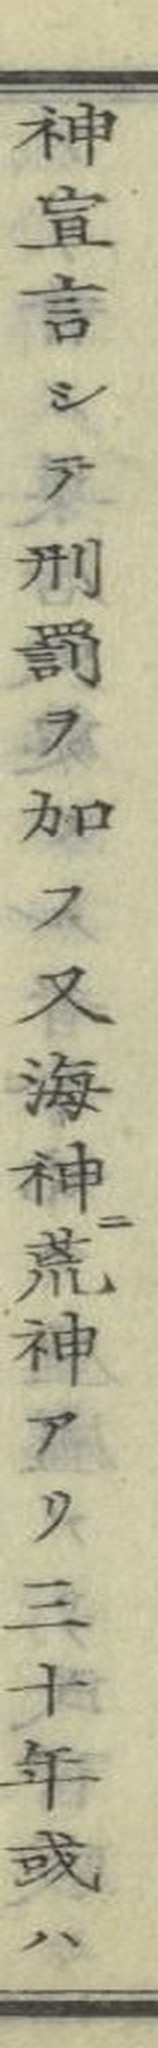神宣言シテ刑罰ヲ加フ又海神荒神アリ三十年或ハ
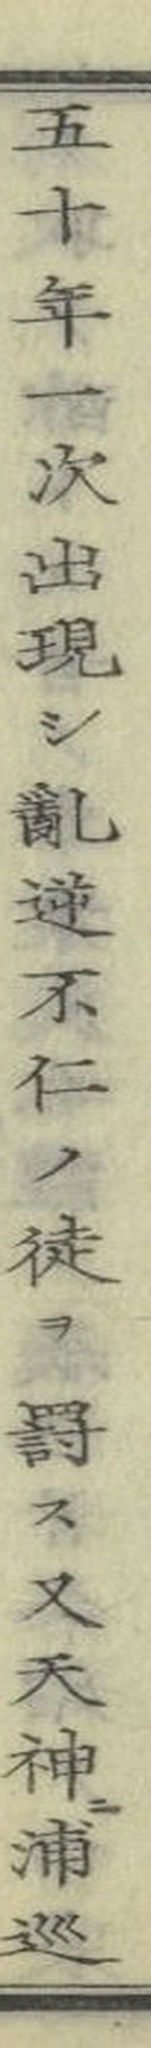五十年一次出現シ亂逆不仁ノ徒ヲ罸ス又天神浦巡
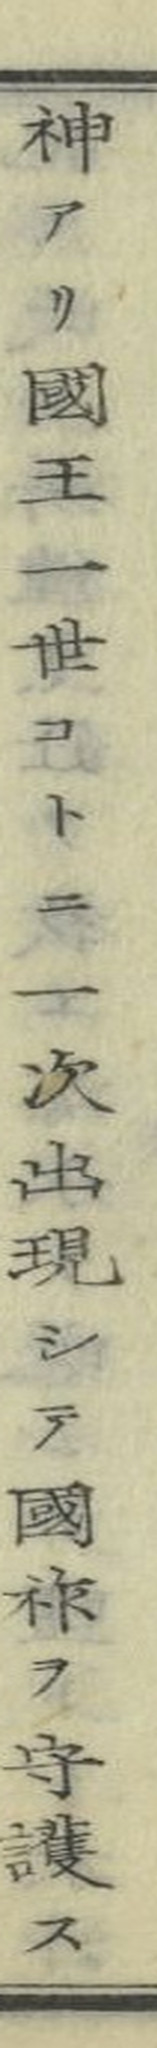神アリ國王一世コトニ一次出現シテ國祚ヲ守護ス
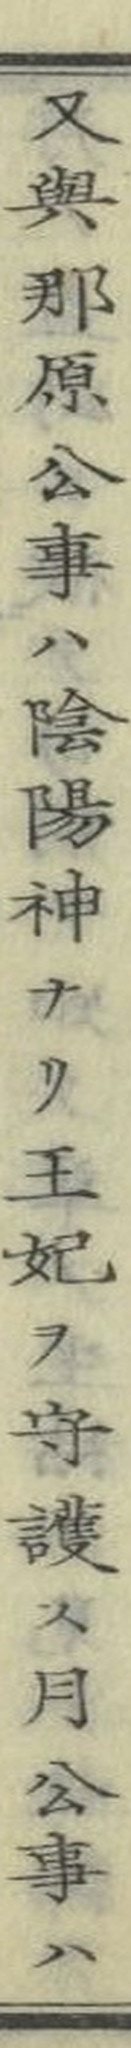又與那原公事ハ陰陽神ナリ王妃ヲ守護ス月公事ハ
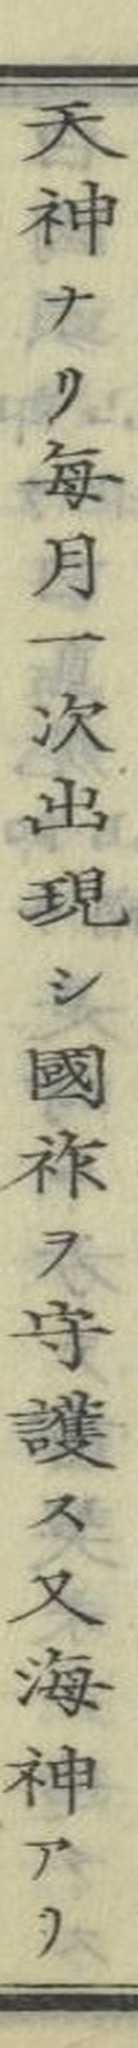天神ナリ每月一次出現シ國祚ヲ守護ス又海神アリ
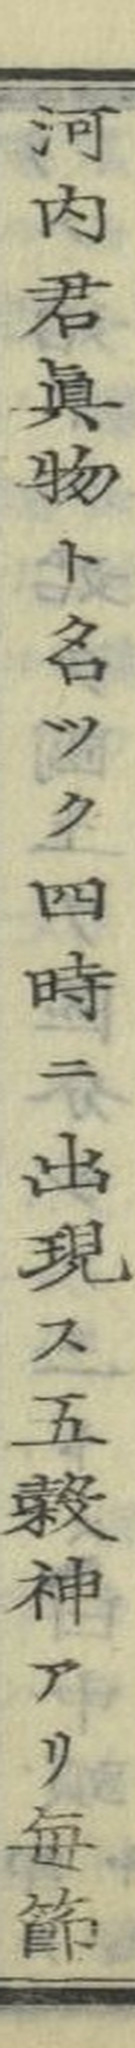河内君眞物ト名ツク四時ニ出現ス五穀神アリ毎節
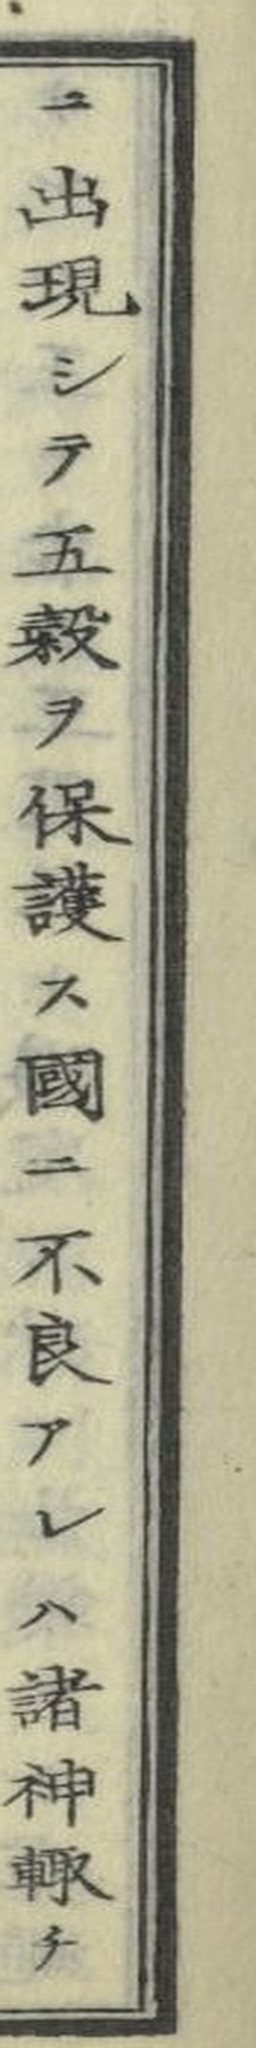ニ出現シテ五穀ヲ保護ス國ニ不良アレハ諸神輙チ
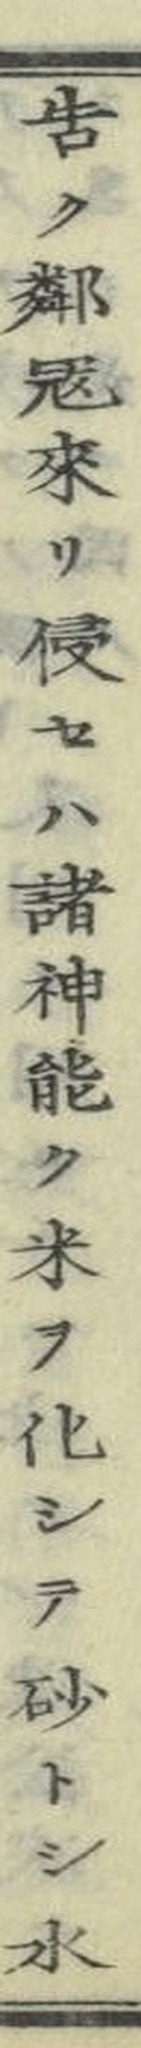告ク鄰冦來リ侵セハ諸神能ク米ヲ化シテ砂トシ水
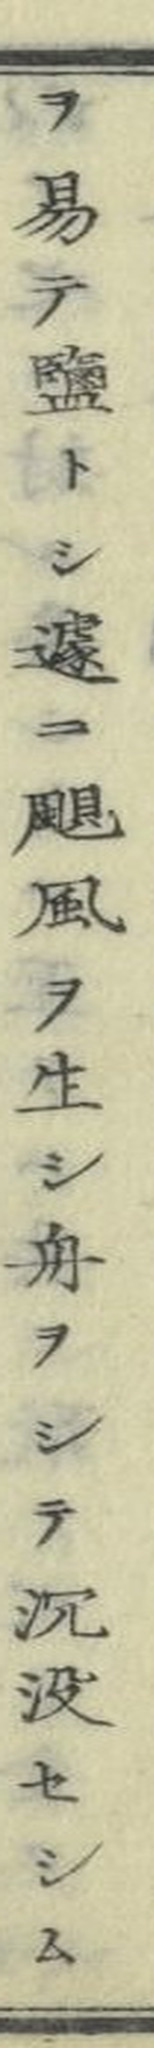ヲ易テ鹽トシ遽ニ颶風ヲ生シ舟ヲシテ沉没セシム
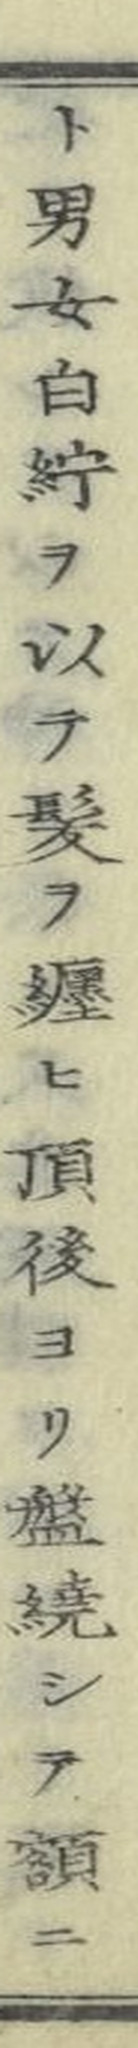ト男女白紵ヲ以テ髮ヲ纏ヒ頂後ヨリ盤繞シテ額ニ
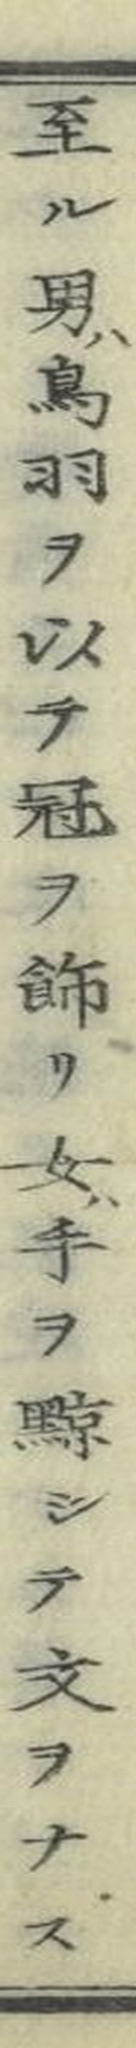至ル男鳥羽ヲ以テ冠ヲ飾リ女手ヲ黥シテ文ヲナス
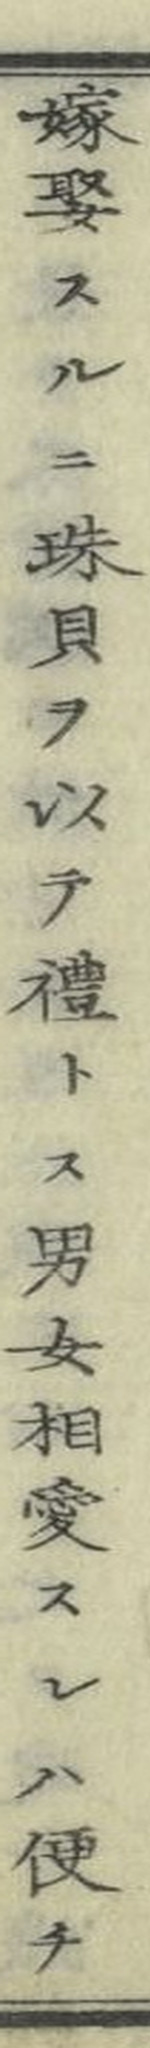嫁娶スルニ珠貝ヲ以テ禮トス男女相愛スレハ便チ
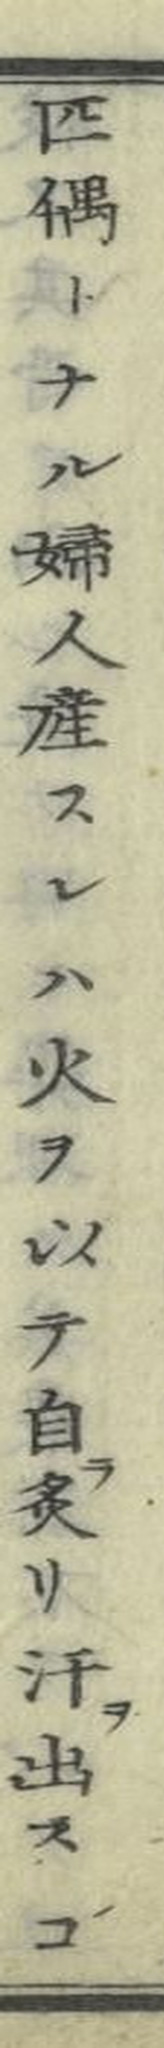匹偶トナル婦人産スレハ火ヲ以テ自炙リ汗出スコ
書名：琉球藩史 一之巻
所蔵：University of the Ryukyus Library
